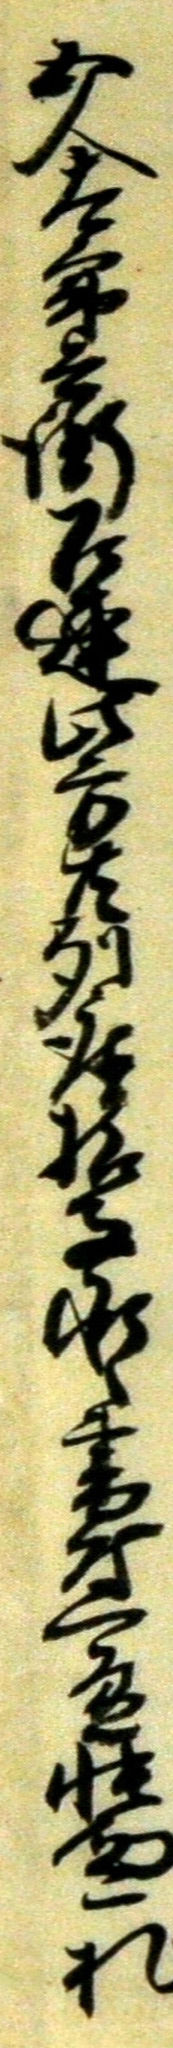五人太郎兵衛召連此方共列座候様子承候書付一通帳面一札

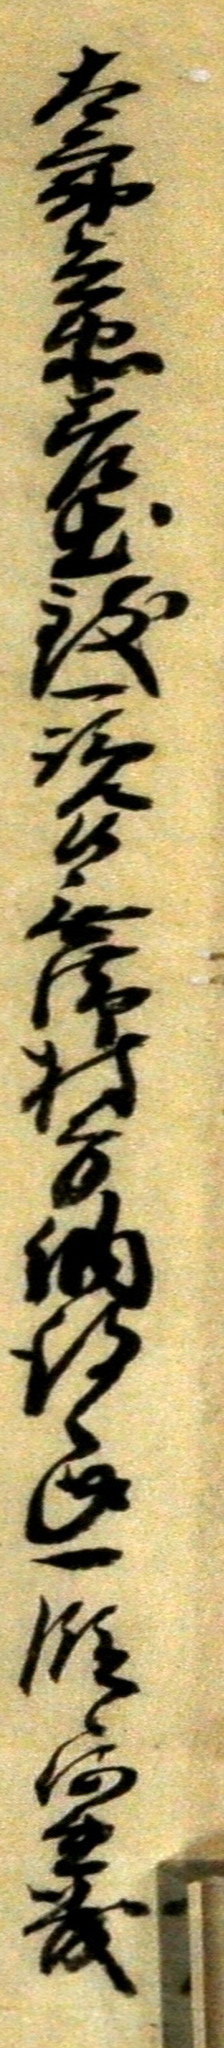太郎兵衛差出致一覧候無滞村方納得候趣一段候何れ茂
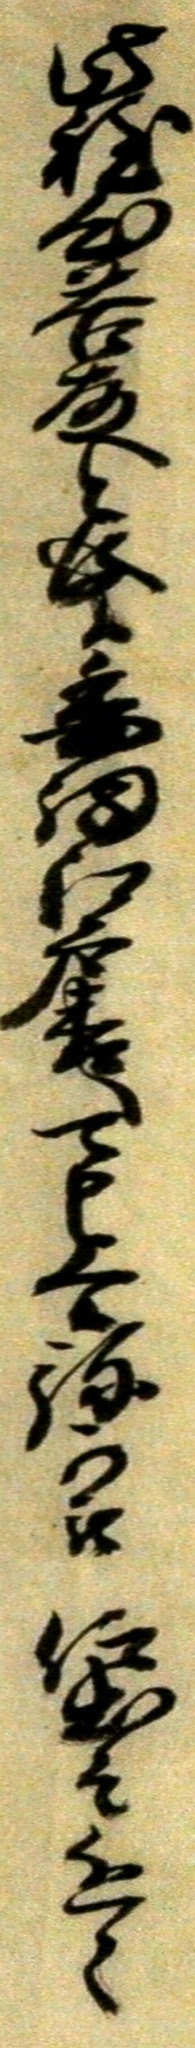此程心答故と存候委細江戸表へ可申上候弥可被仰出之近々
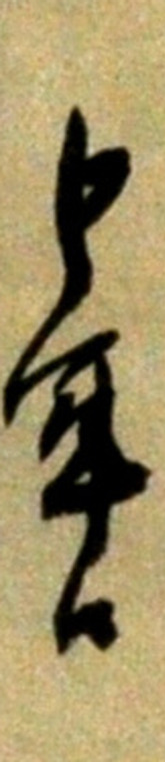申聞候
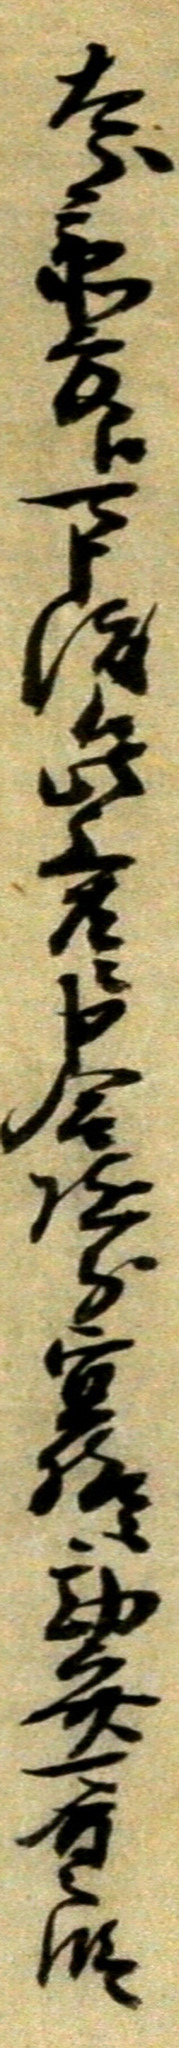太郎兵衛方江可申渡候此上共ニ申合随分宜様ニ勘弁可有之段
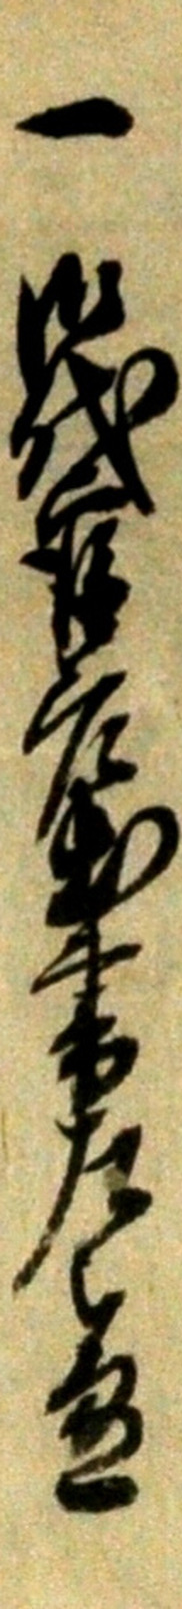一御代官差出書左之通
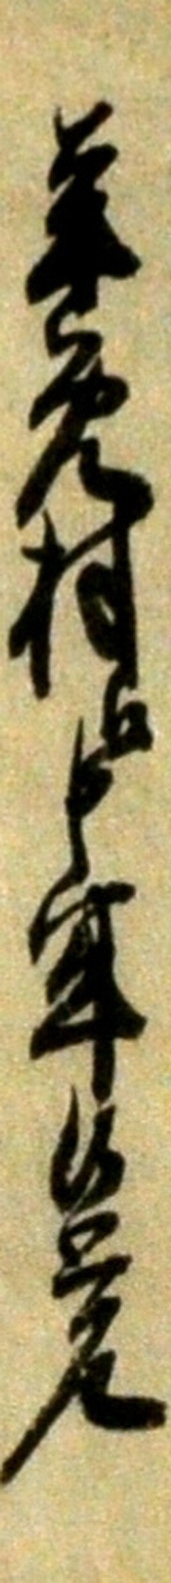年免村江申聞候覚
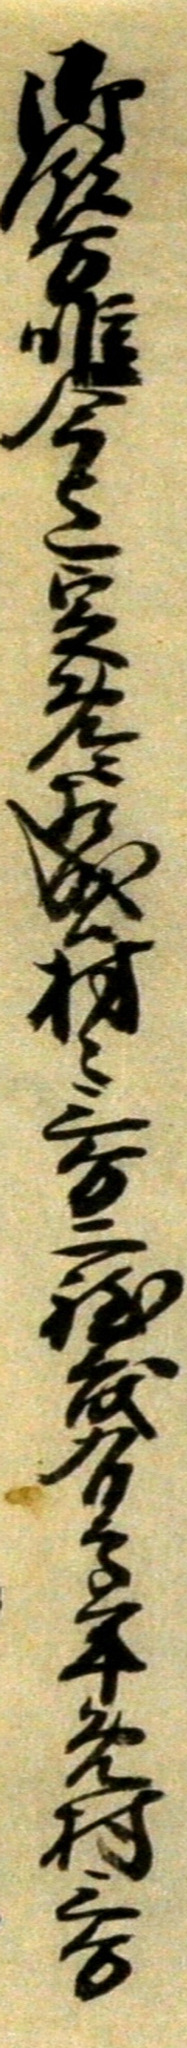御領分唯今迄定免ニ相成候村々三分ニ程茂有之年免村三分
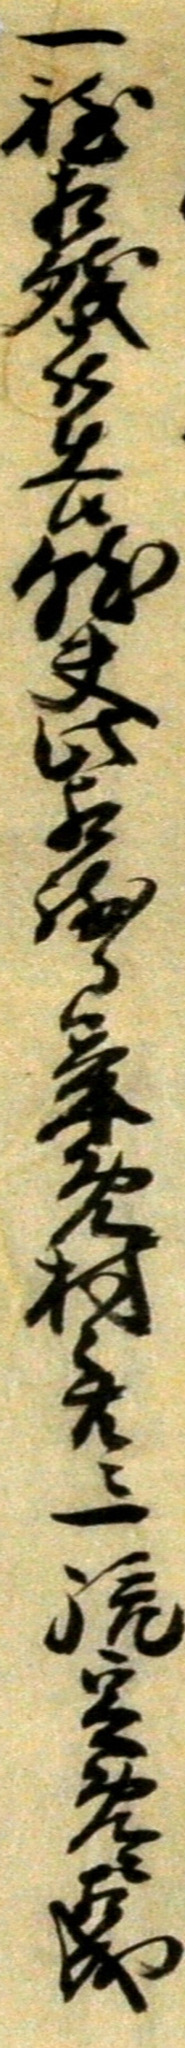一程相残罷在候就夫此相残り候年免村々共ニ一統定免ニ相成
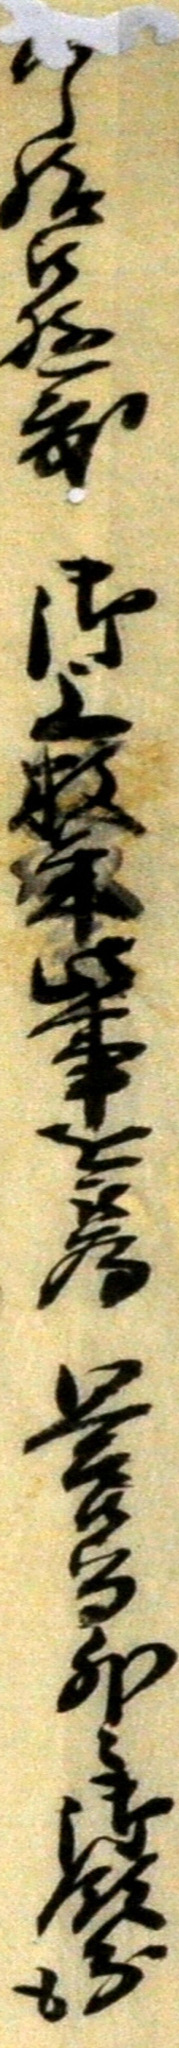候之様被遊度御上数年此事を被為思召候間外ニ御領分も
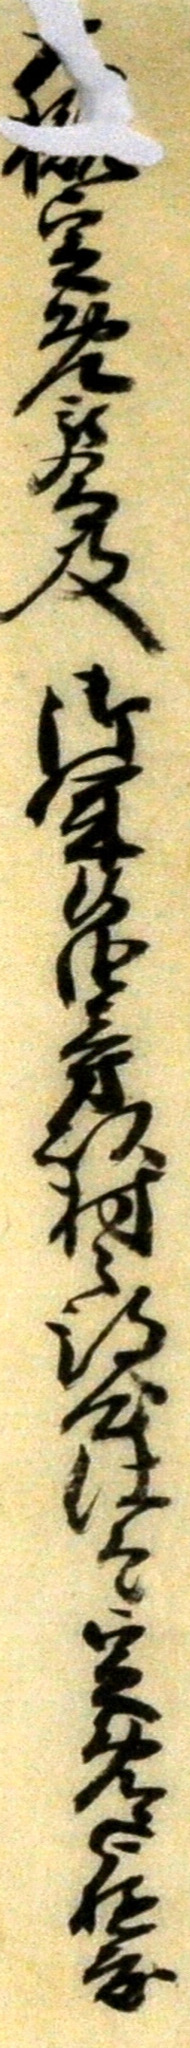大概定免被為及御聞候由旁以村々得心仕候ハヽ定免ニ被遊度
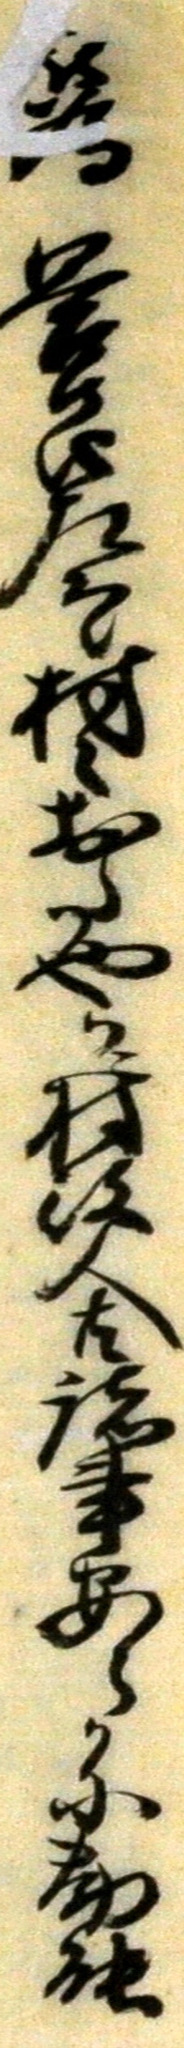被為思召候由左之村々おたやかニ村役人共諸事安らかに能
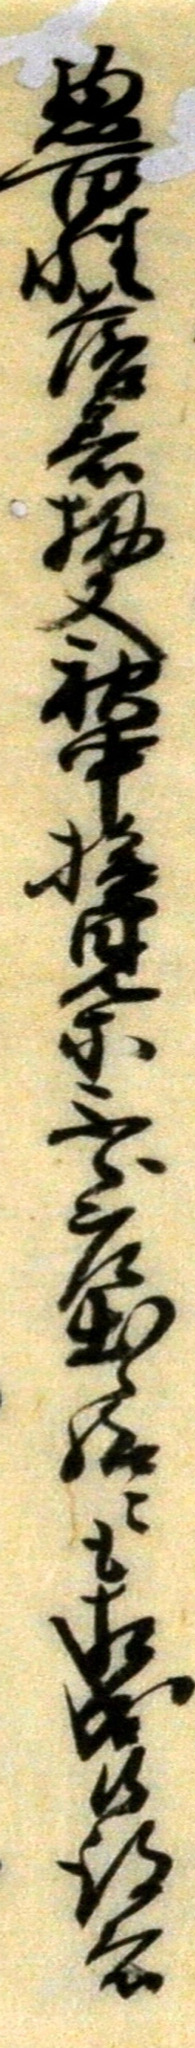惣百性落着扨又秋中検見等不被差出候様ニも相成候得者
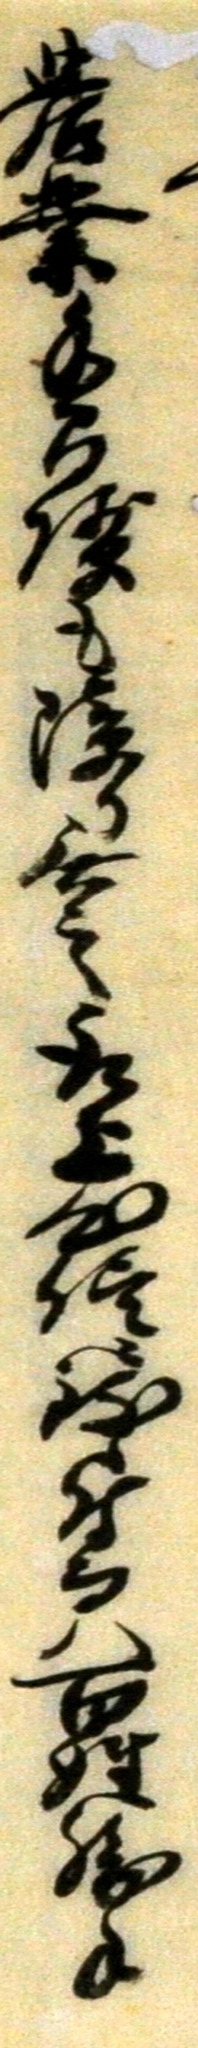農業手間隙も障無之取上心侭ニ致候付而ハ百姓勝手
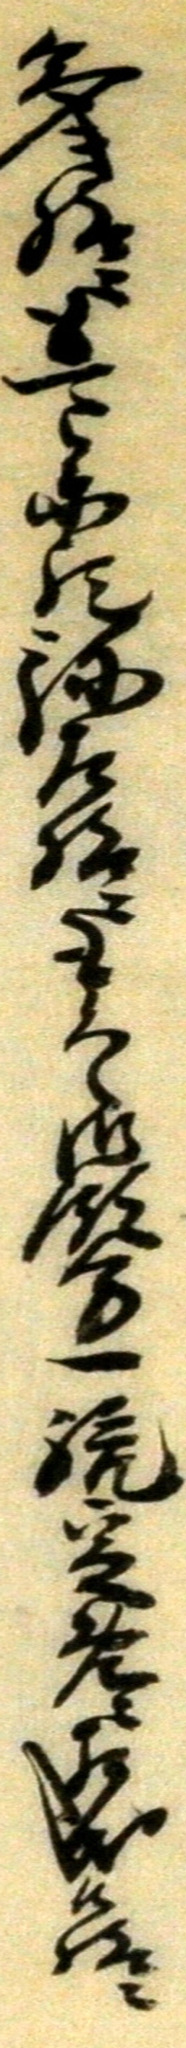多キ様ニも可参歟弥左様ニも候ハヽ御領分一統定免ニ相成候様ニ
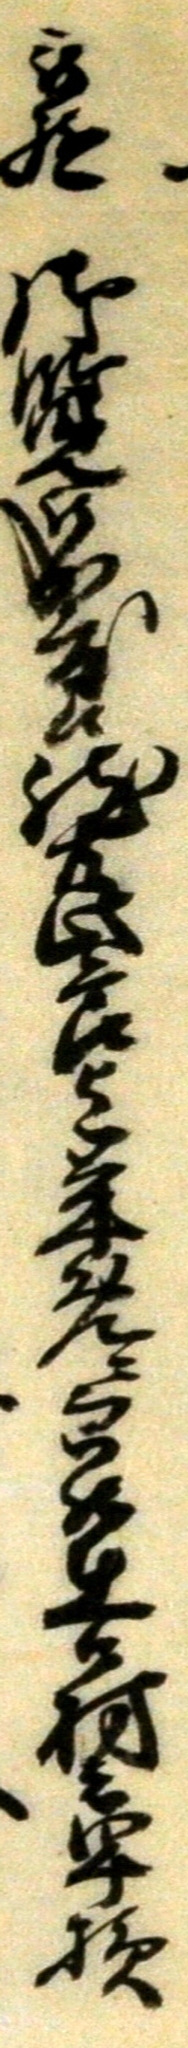被遊御覧被成度候然共此節迄年免ニ而罷在候村者旱損
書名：留書
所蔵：伊那市立高遠町図書館・合同会社AMANE
